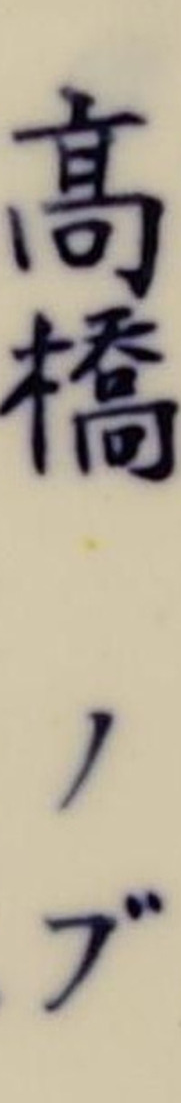高橋ノブ
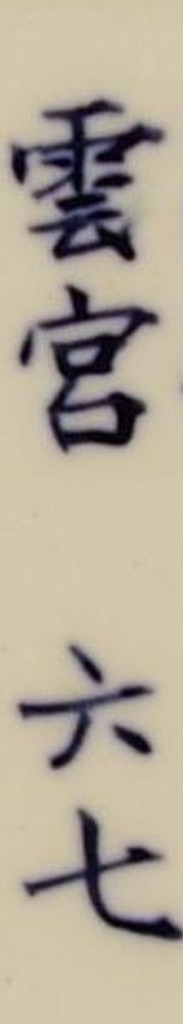雲宮六七
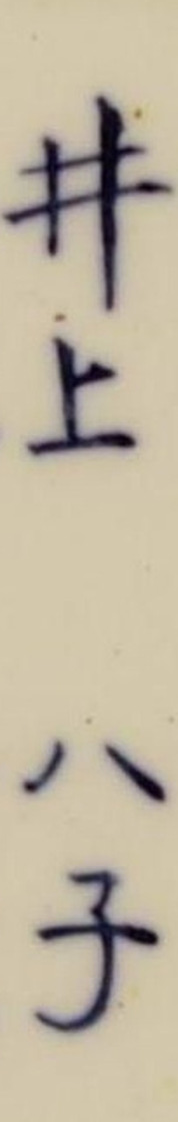井上ハ子
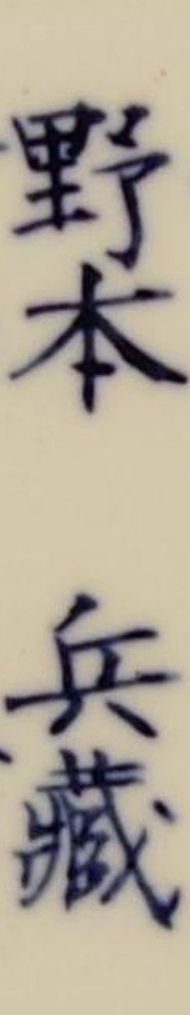野本兵蔵
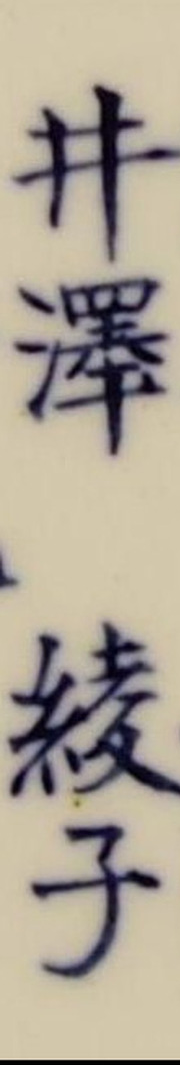井澤綾子
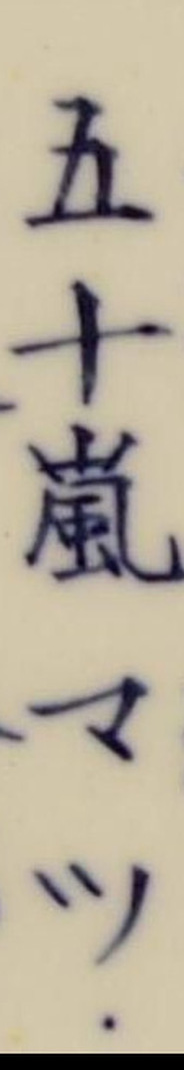五十嵐マツ
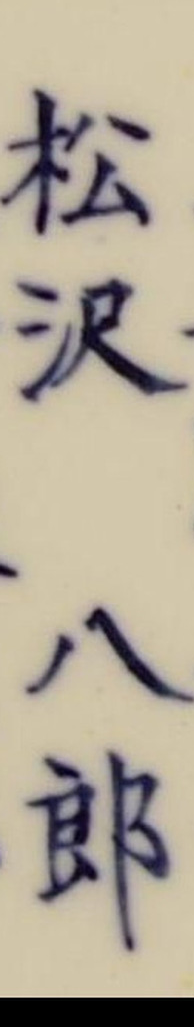松沢八郎
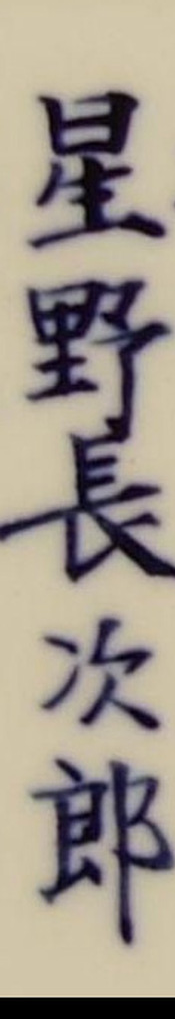星野長次郎
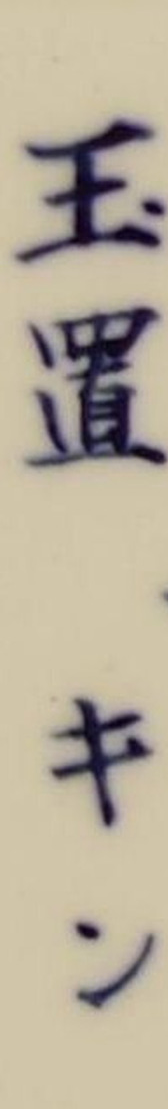玉置キン
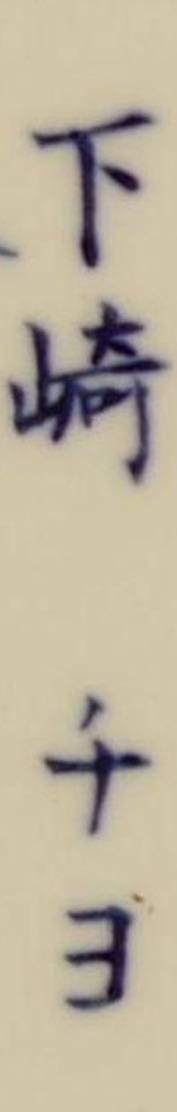下崎チヨ
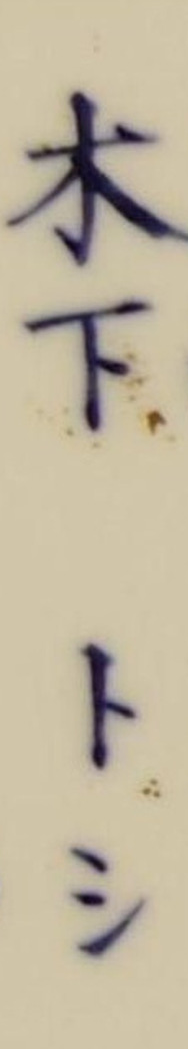木下トシ
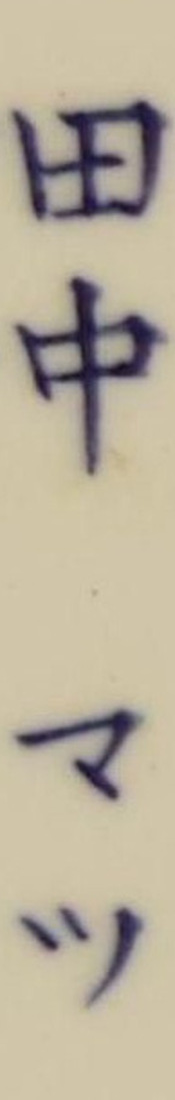田中マツ
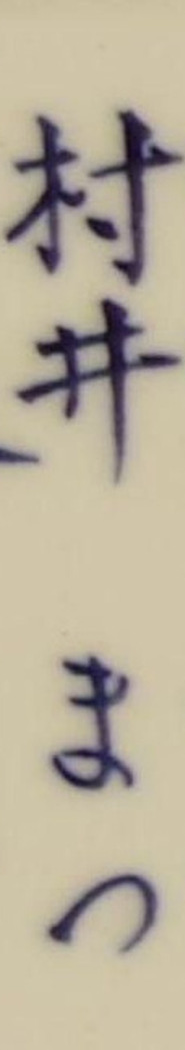村井まつ
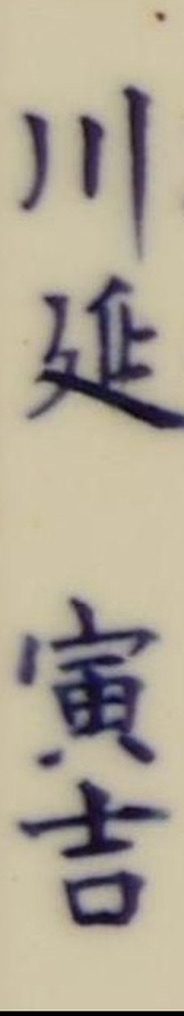川延寅吉

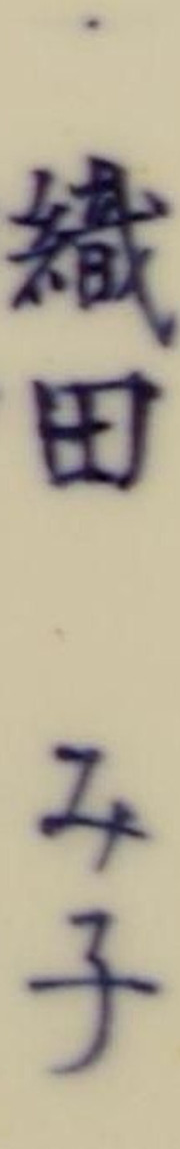織田み子
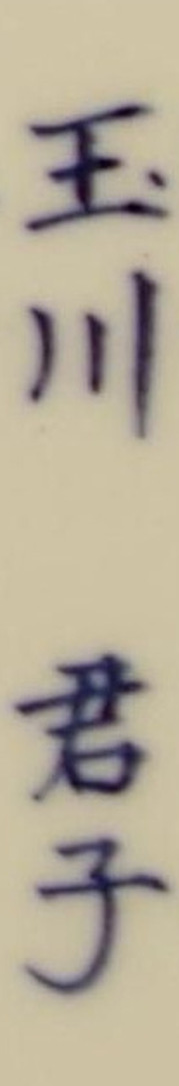玉川君子
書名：E~L
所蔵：高野山金剛峯寺
